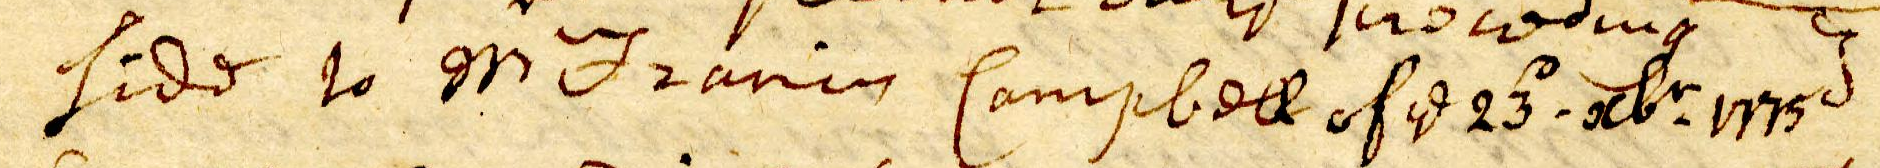Side to M Francis Campbell of y^e 23^d. ocb^r. 1775
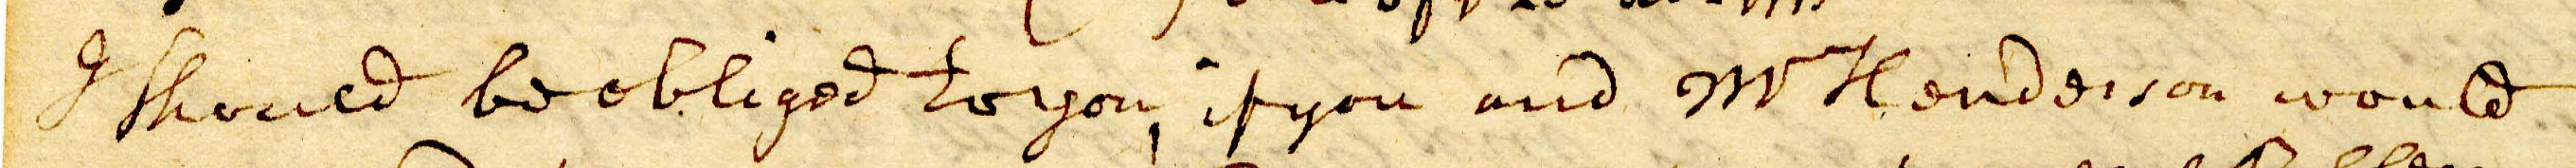I Should be obliged to you, if you and M^r Henderson would
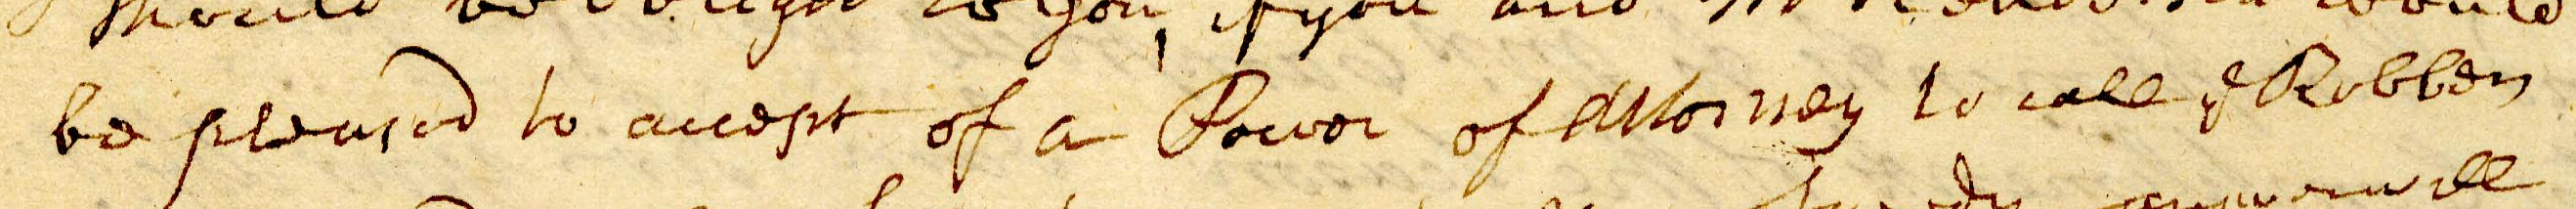be pleased to accept of a Power of Attorney to call y^e Robbey
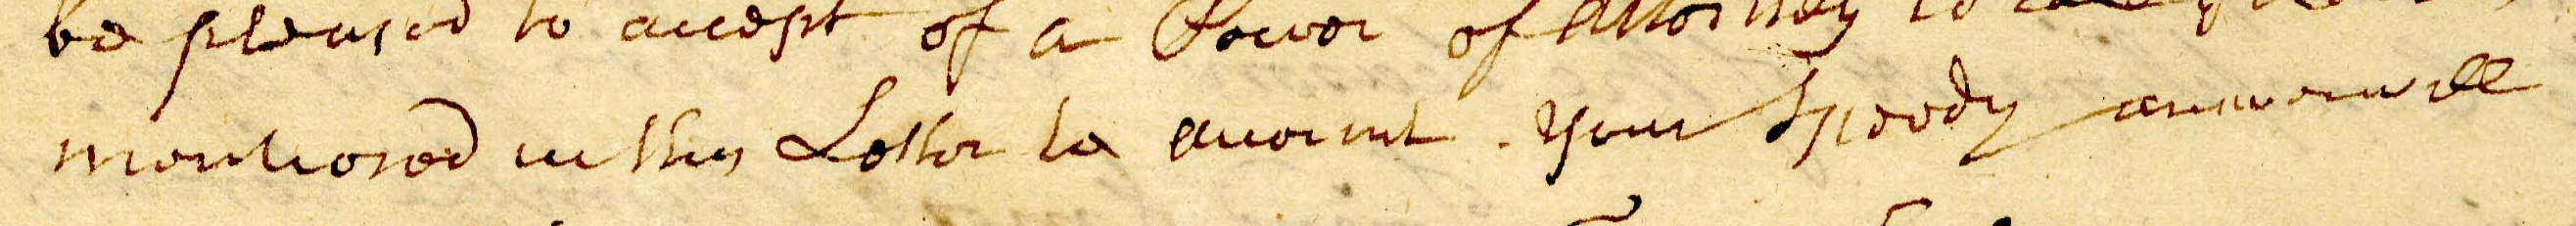mentioned in the Letter to account. Your speedy arrival will
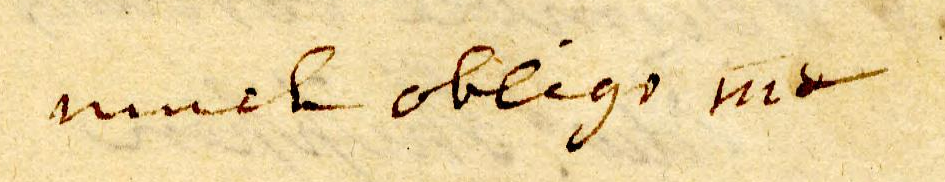much oblige me
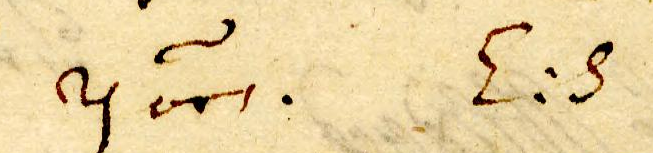Yors. E:S
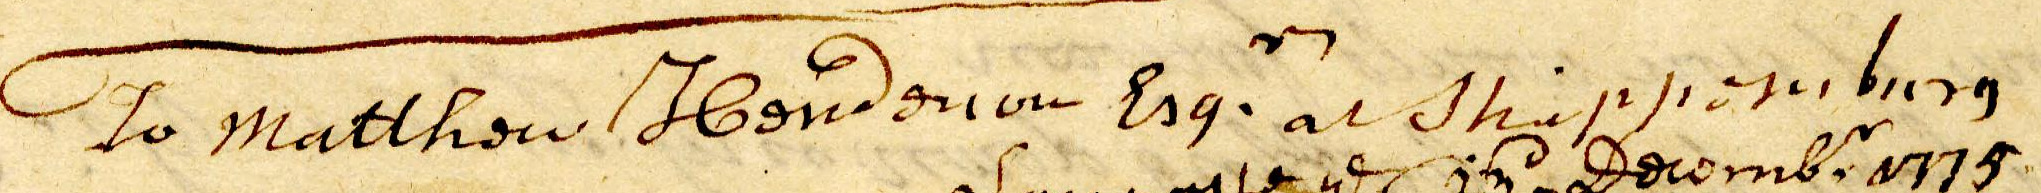To Matthew Henderson Esq.^r at Shippensburg
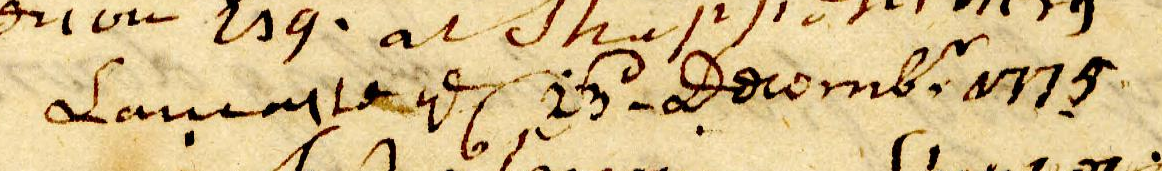Lancaster y^e 23^d. Decemb^r. 1775
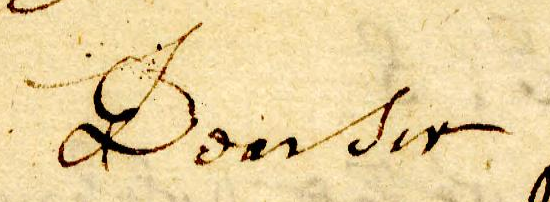Dear Sir
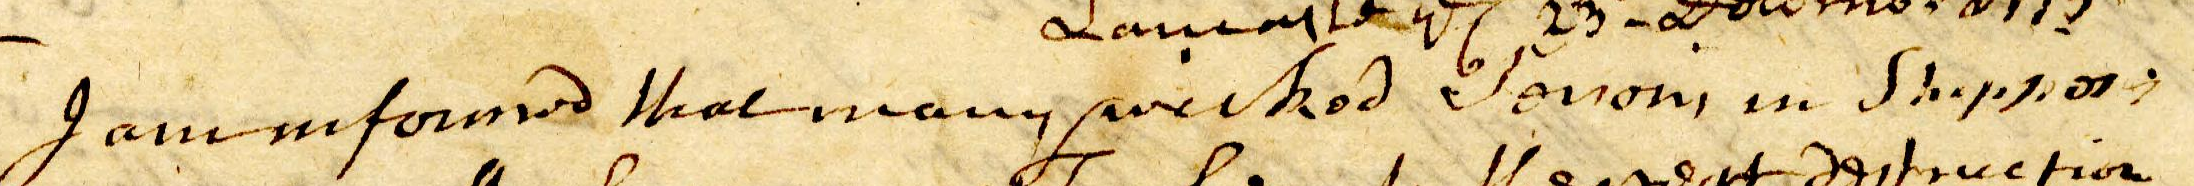I am informed that many wicked Persons in Shippens
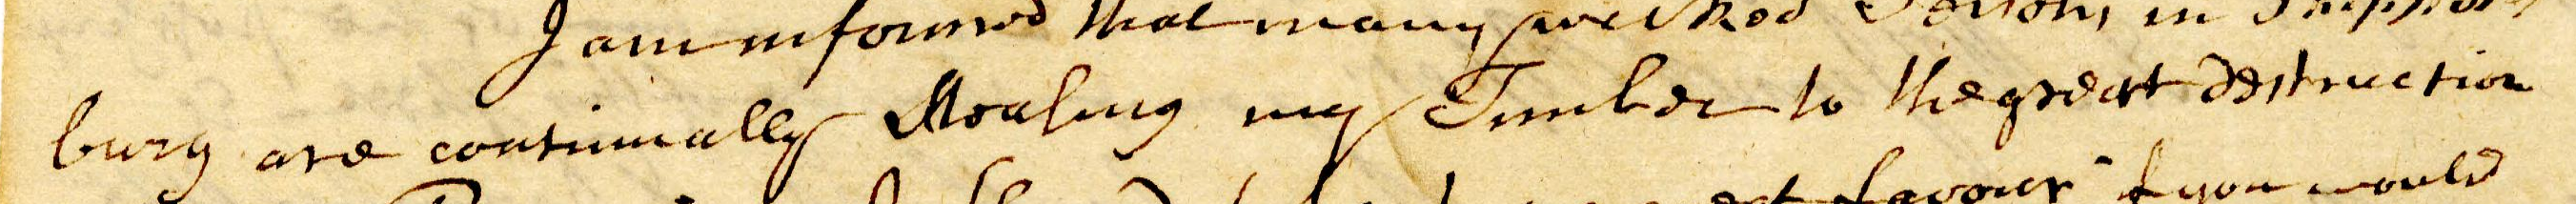bury are continually Stealing my Timber to the great destruction
